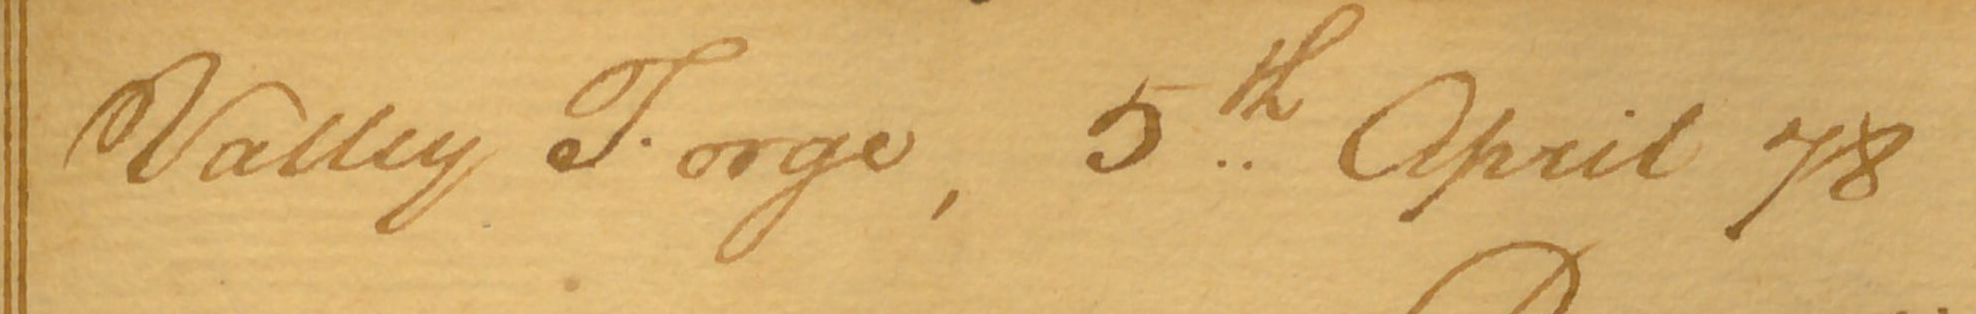Valley Forge, 5^th. April 78
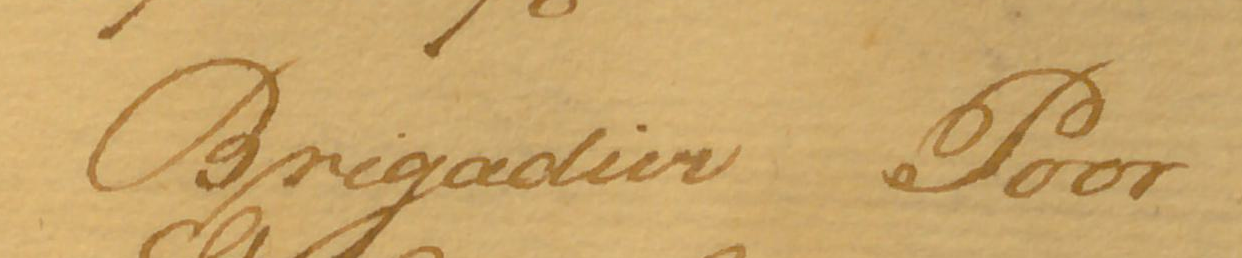Brigadier Poor
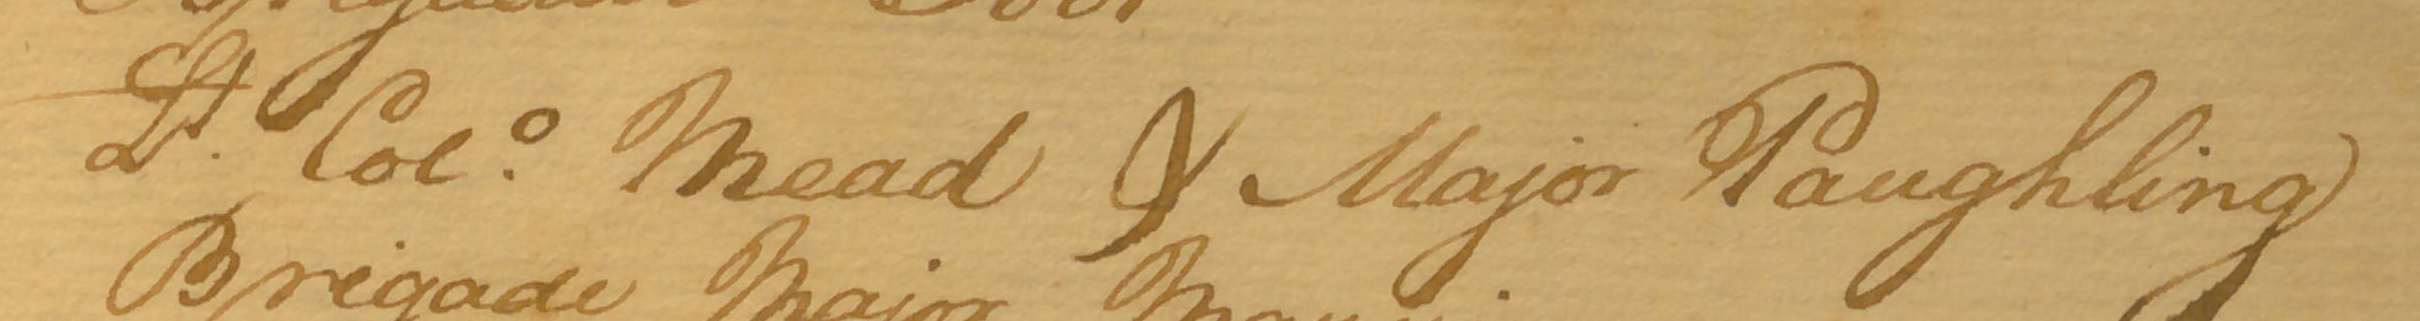L^t. Col^o. Mead & Major Paughling
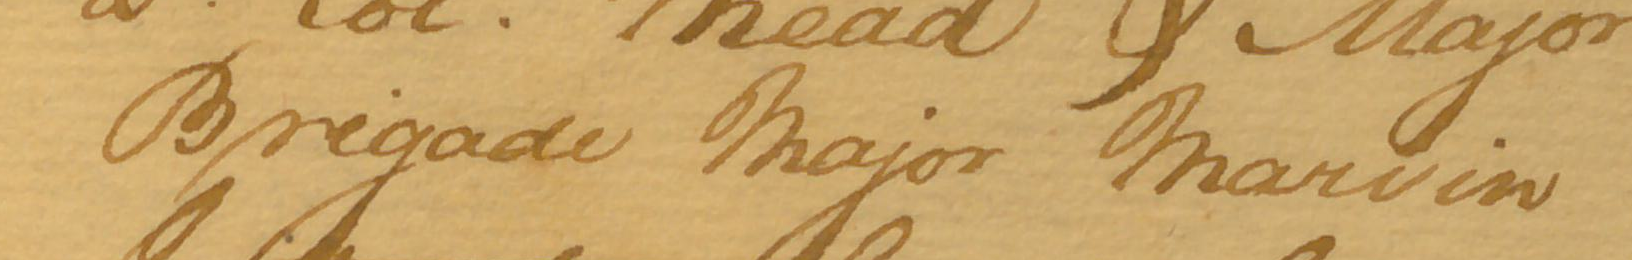Brigade Major Marvin
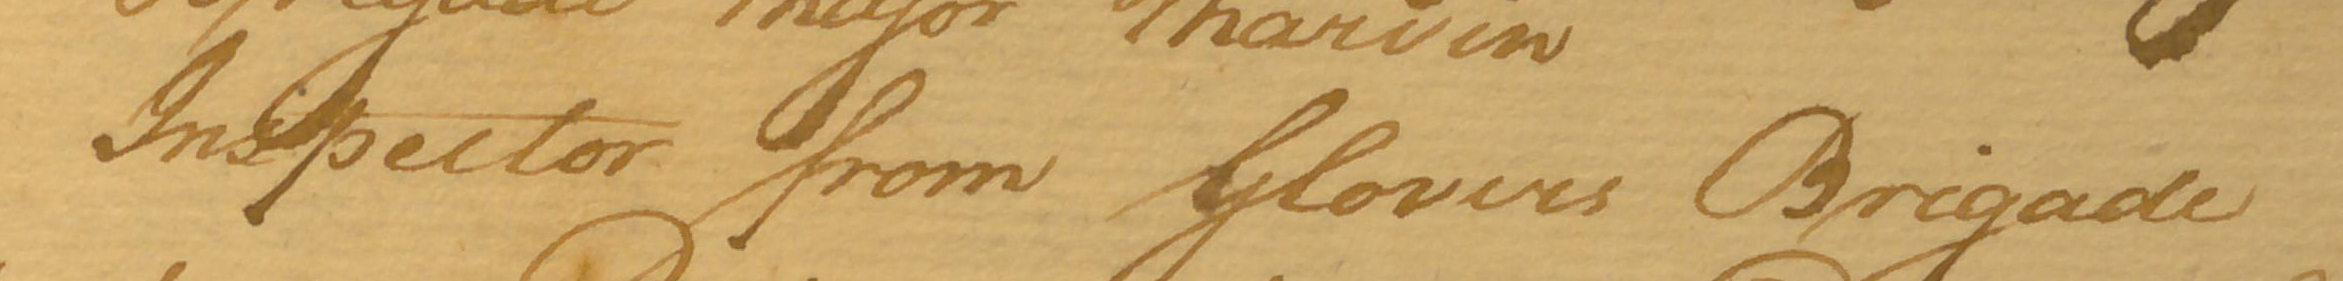Inspector from Glovers Brigade
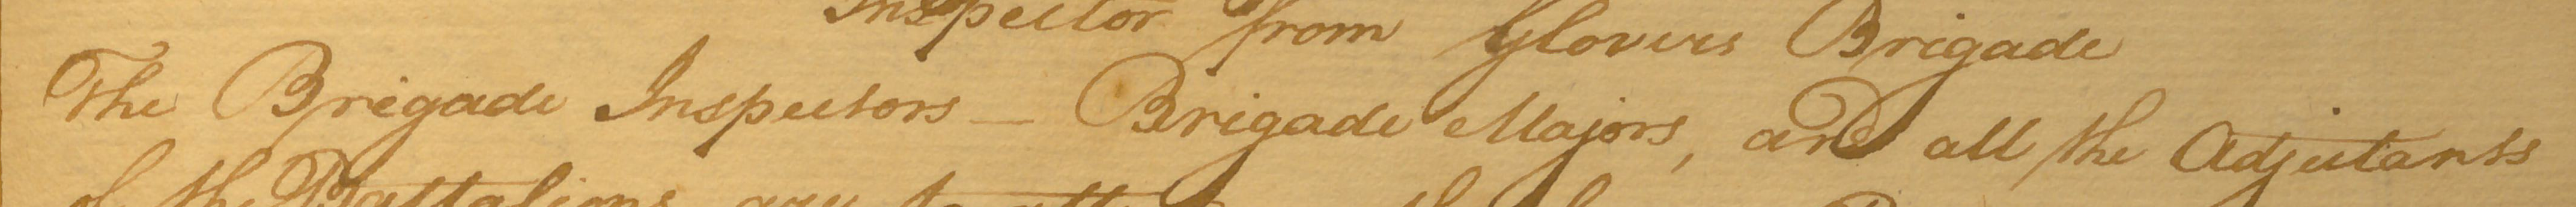The Brigade Inspectors- Brigade Majors, and all the Adjutants
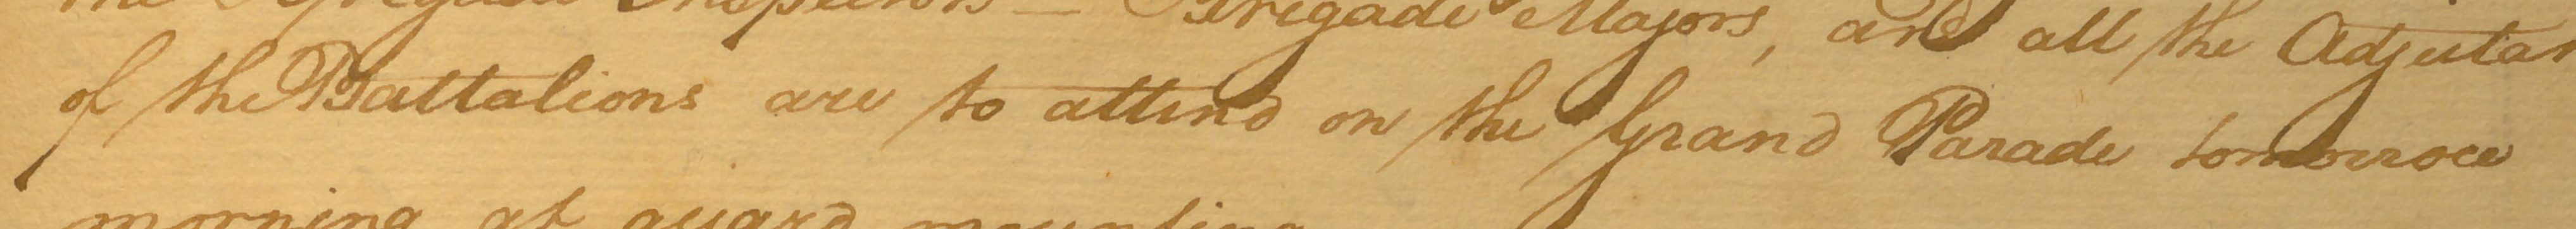of the Battalions are to attend on the Grand Parade tomorrow
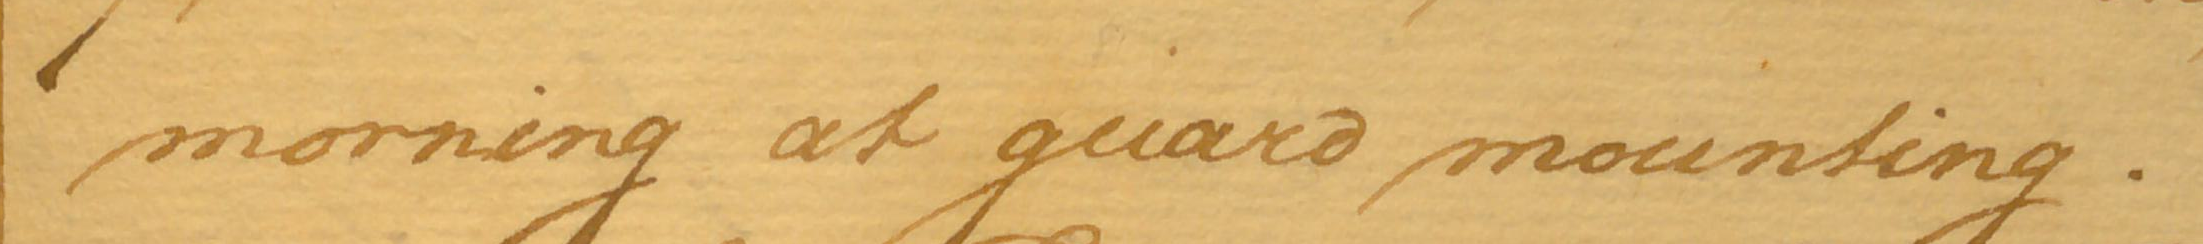morning at guard mounting.
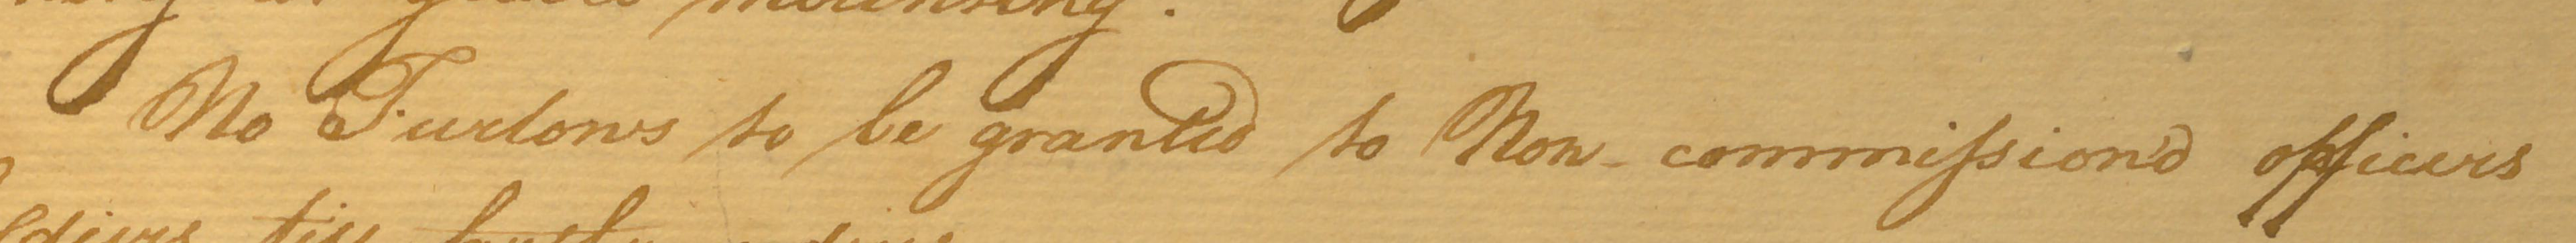No Furlows to be granted to Non-commissioned officers
